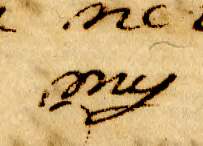my
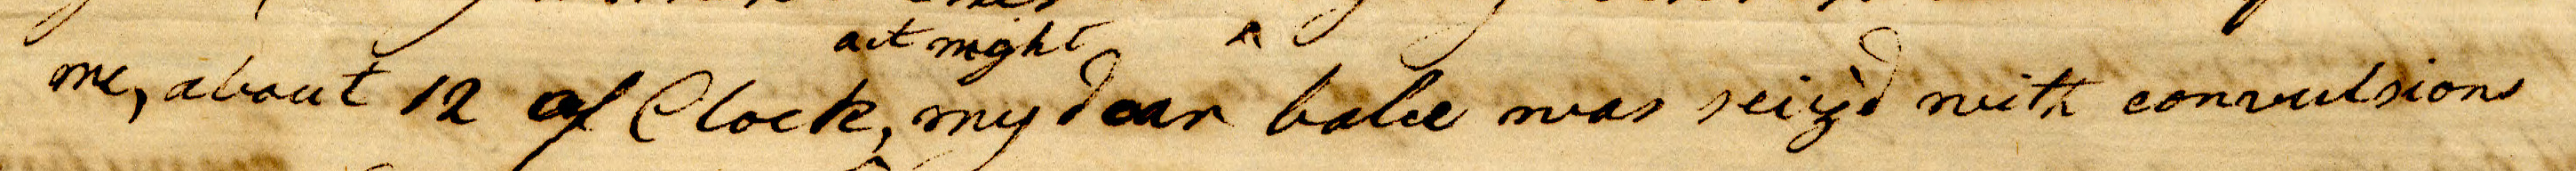me, about 12 of Clock ^ my dear babe was seiz'd with convulsions
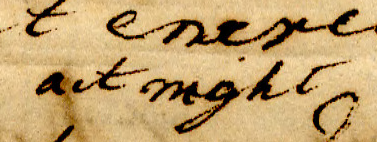at night
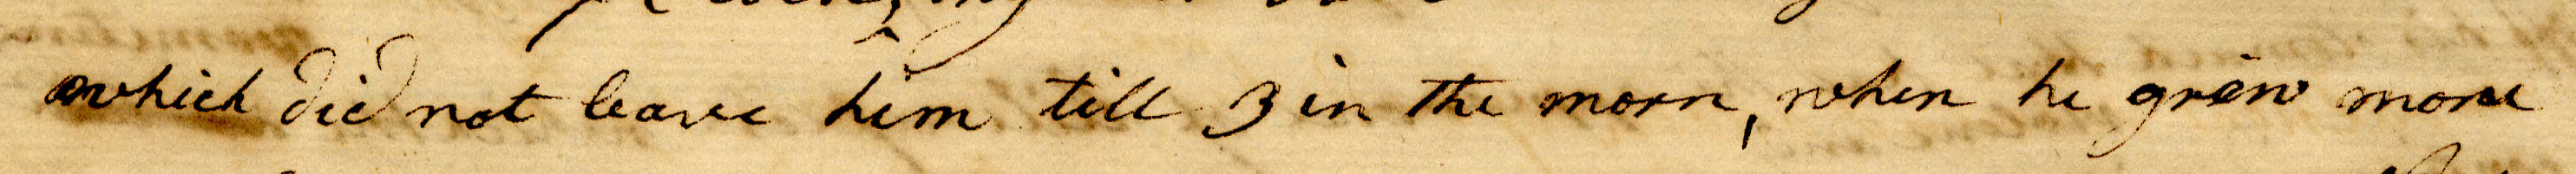which did not leave him till 3 in the morn, when he grew more
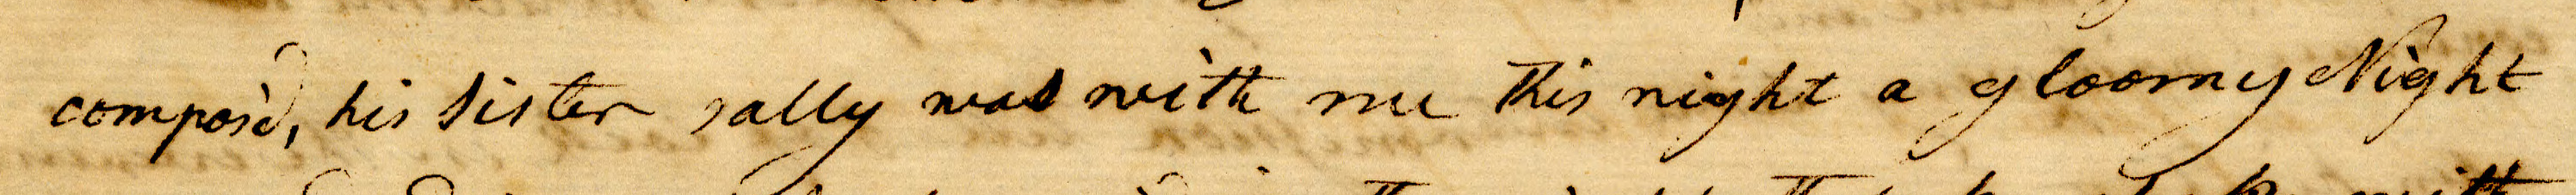compos'd, his sister sally was with me this night a gloomy Night
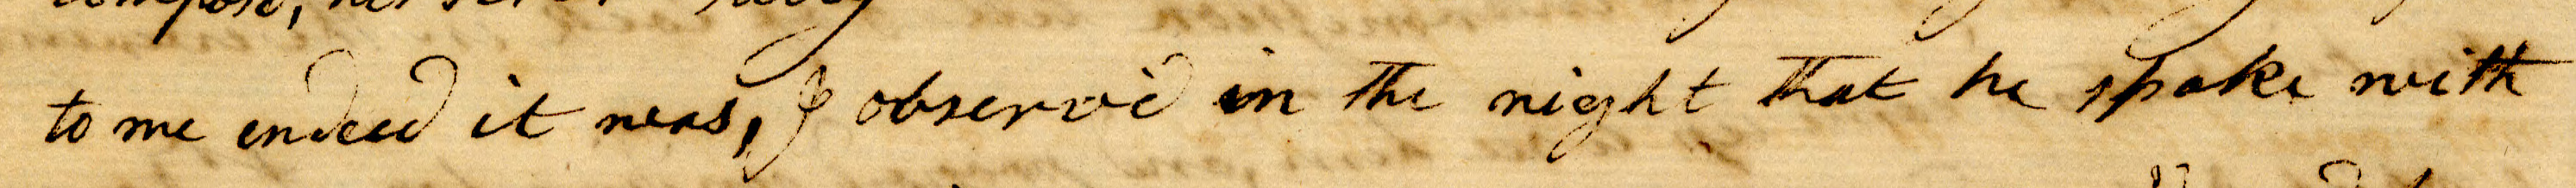to me indeed it was, I observ'd in the night that he spake with
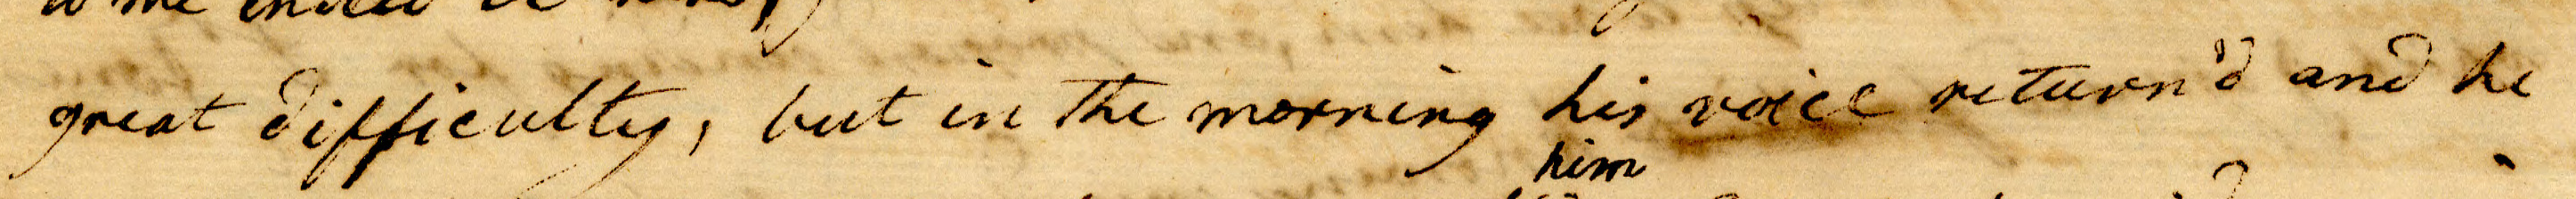great difficulty, but in the morning his voice return'd and he
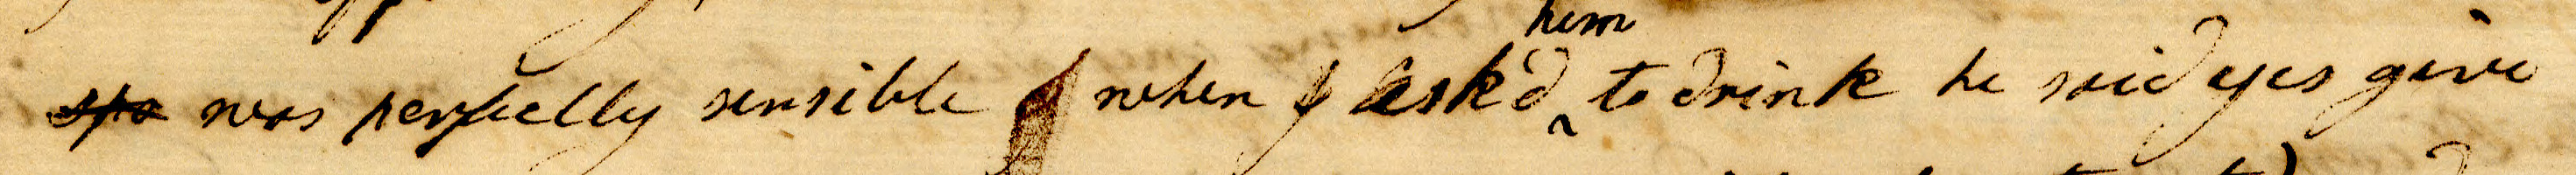[spo] was perfectly sensible when I askd ^ to drink he said yes give
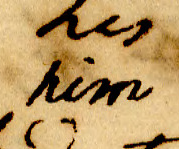him
